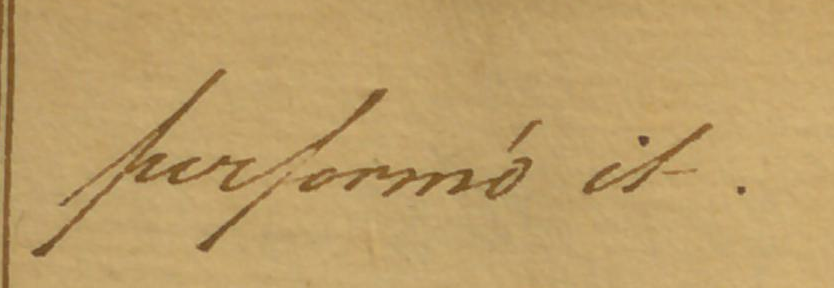perform'd it.
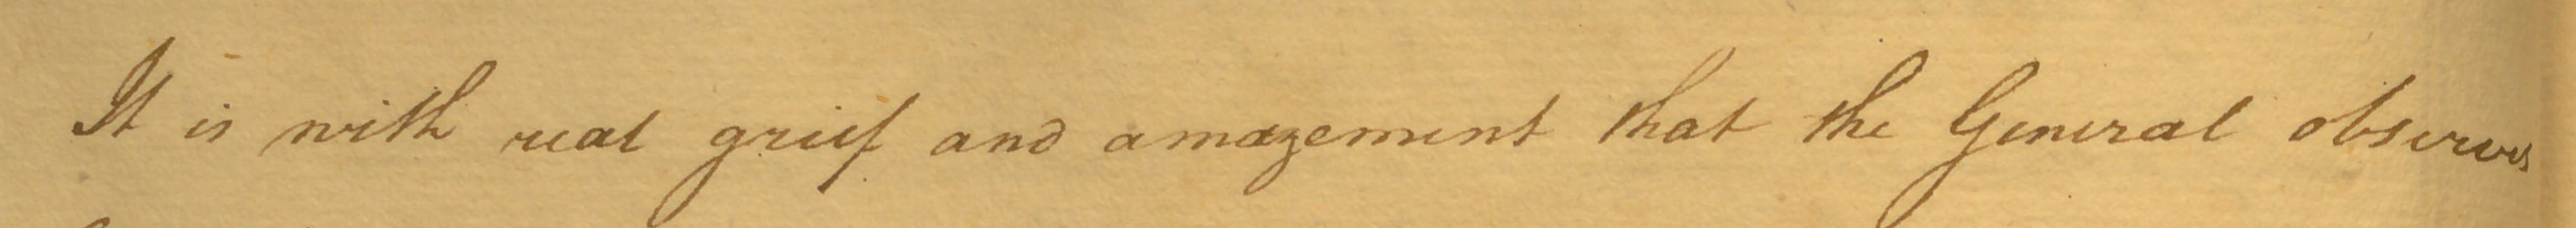It is with real grief and amazement that the General observes
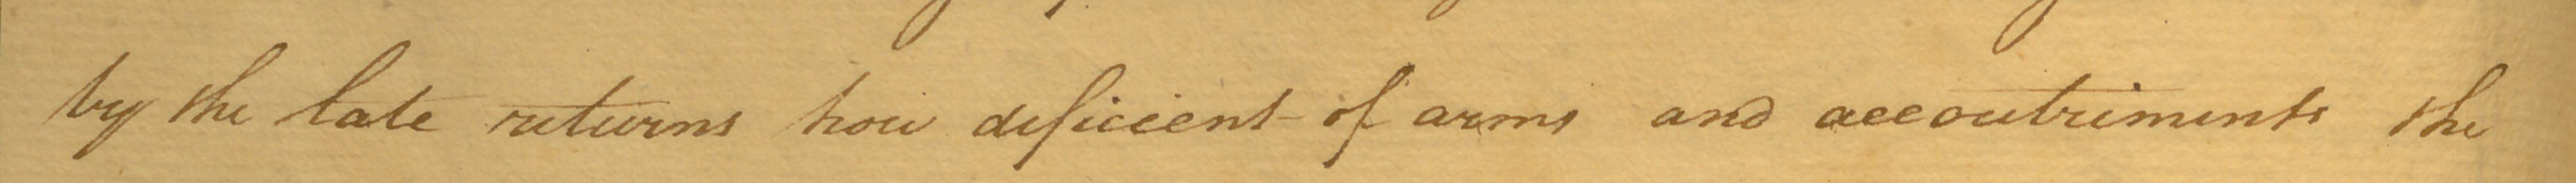by the late returns how deficient of arms and accoutriments the
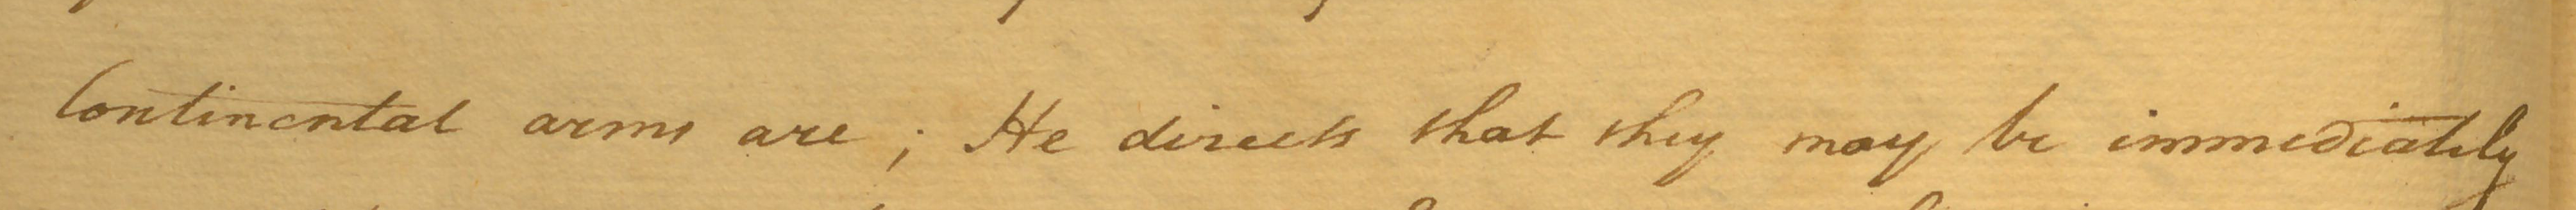Continental arms are; He directs that they may be immediately
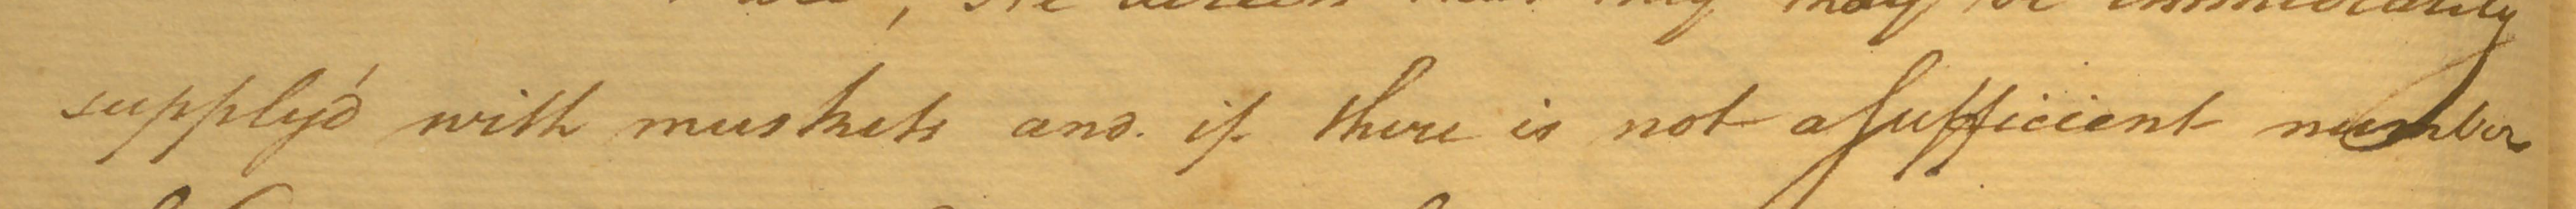supply'd with muskets and if there is not a sufficient number
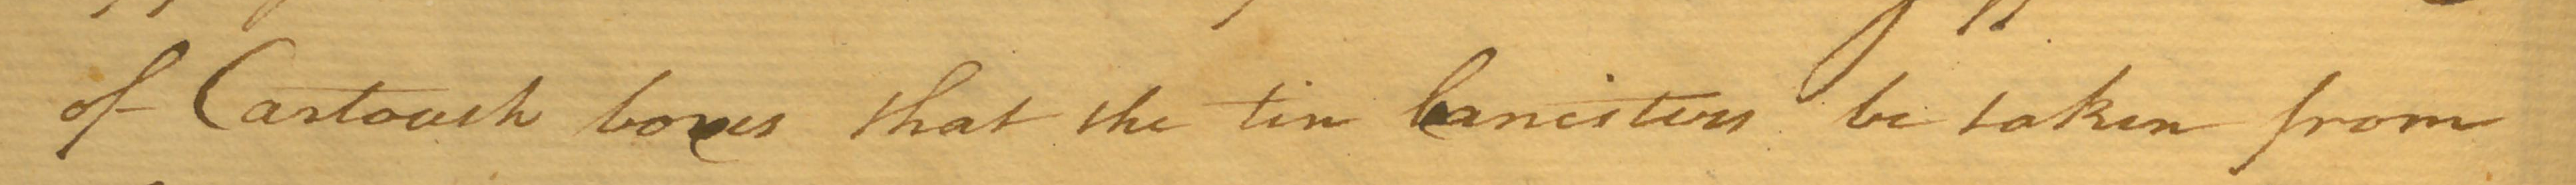of Cartouch boxes that the tin Canisters be taken from
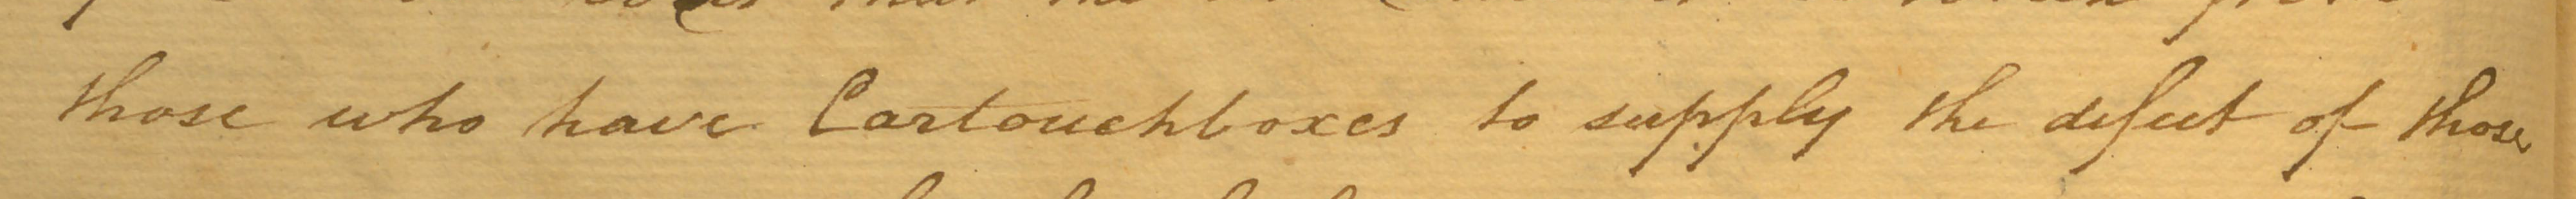those who have Cartouchboxes to supply the defect of those
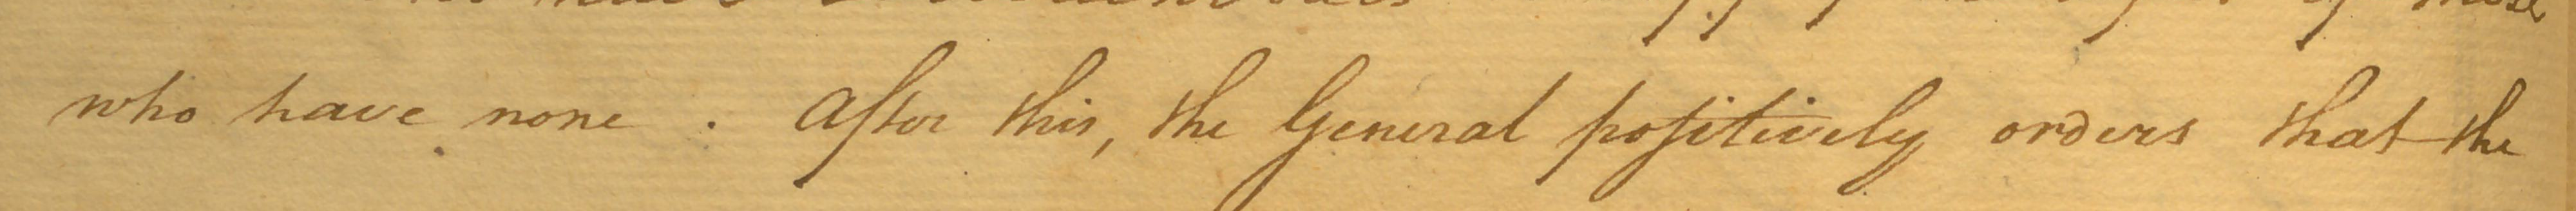who have none. After this, the General positively orders that the
